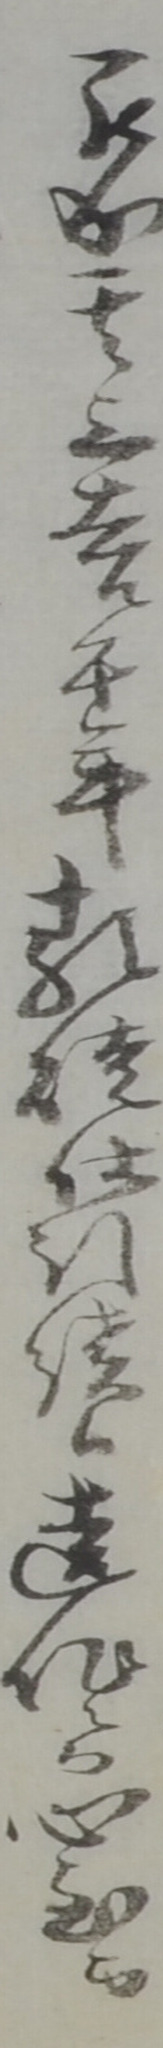罷成其上去ル午年類焼仕引続候違作ニ而心至而
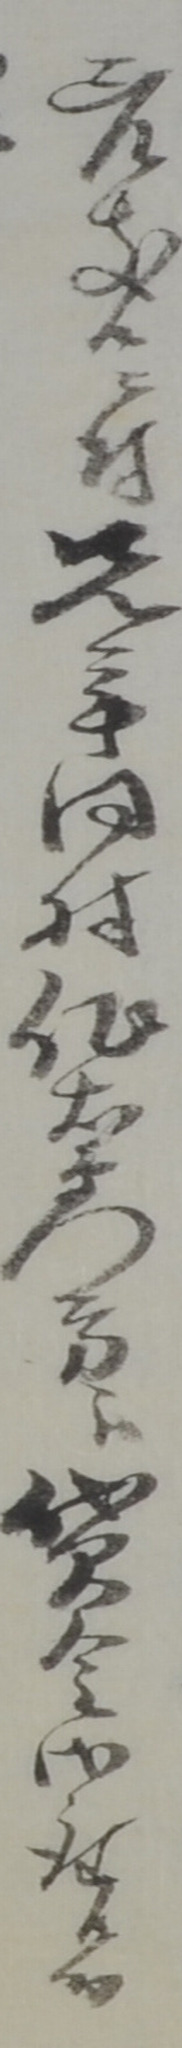差支候ニ付先年同村作右衛門方え貸金御座候而
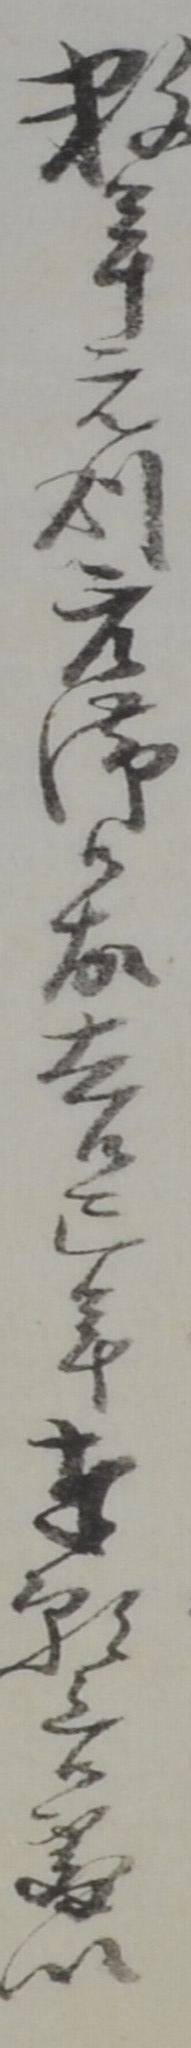数年元利差滞候故去ル巳年奉願上候処以
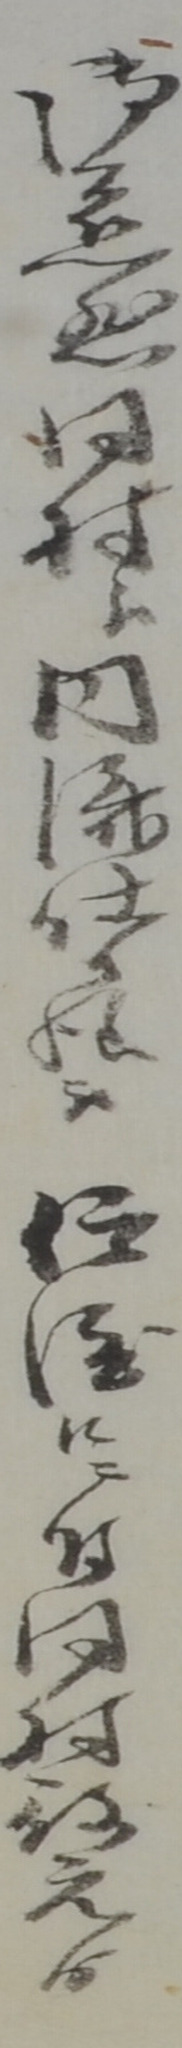御慈悲同村え内済仕候様被仰渡候ニ付同村役元より
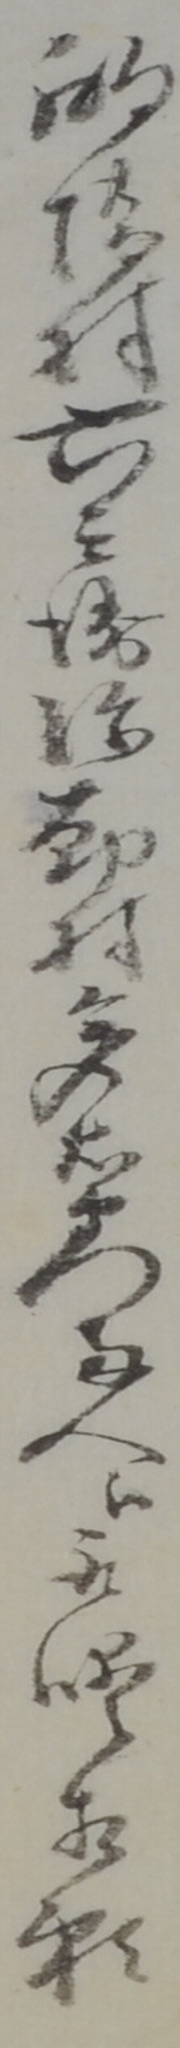的場村六兵衛弥勒村多右衛門両人え取噯相願
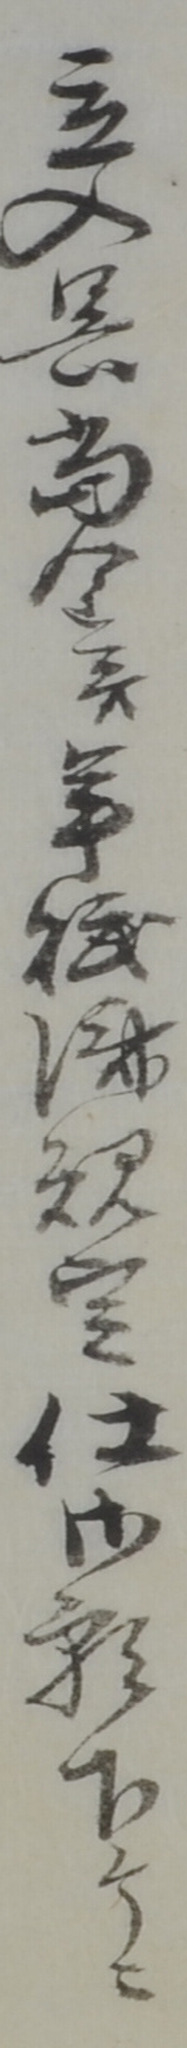立入呉当金幷年賦済規定仕御願下ケニ
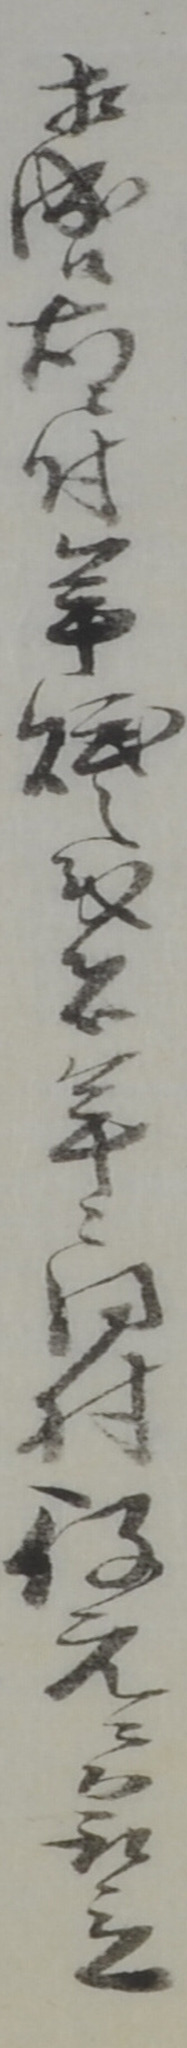相成候右ニ付年賦之義者年ニ同村役元ニ而取立
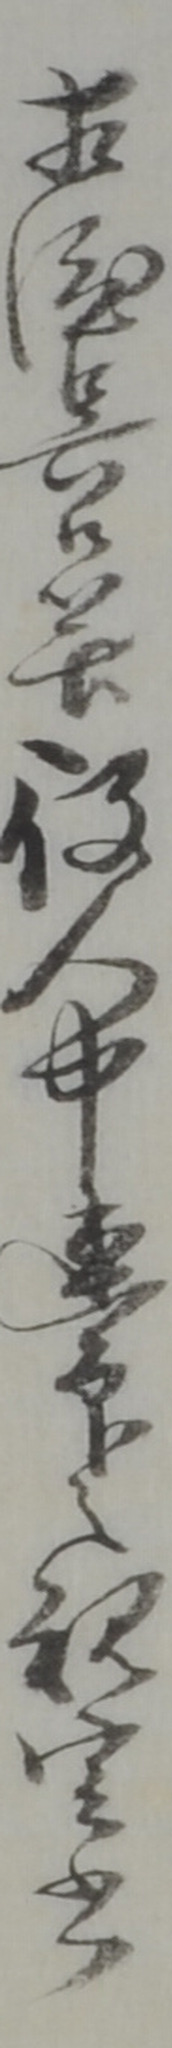相渡呉候筈役人中連印之規定書
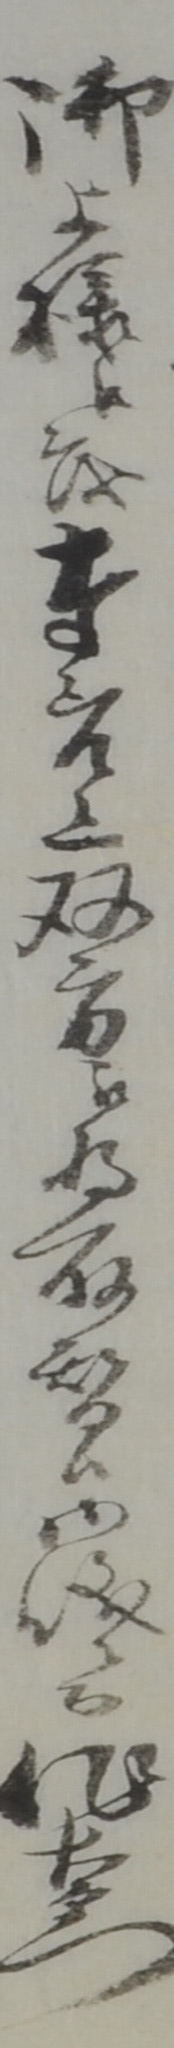御上様えも奉差上双方被為取替候御儀ニ而作右衛門
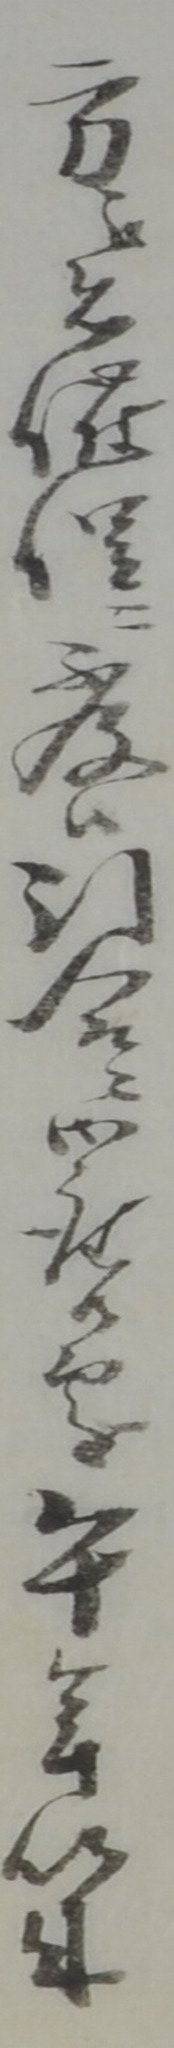方え者催促ニ不及候引合ニ御座候処午年以来
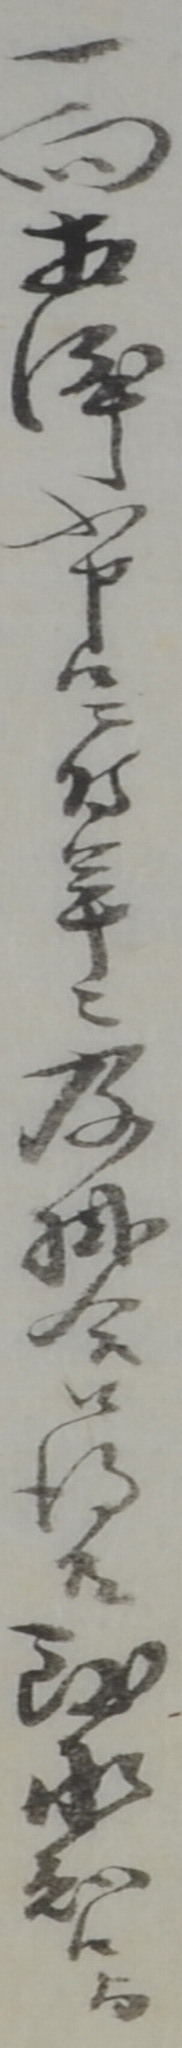一向相渡し不申候ニ付年々及掛合候得共致承知候と
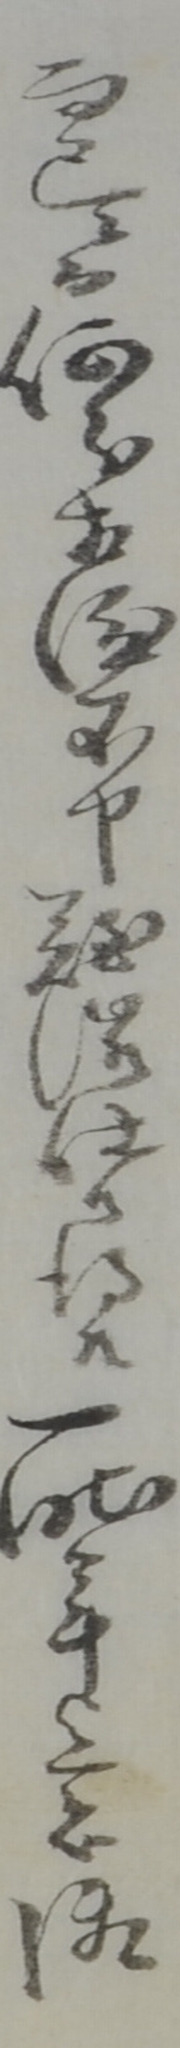而已ニ而何分相渡不申難渋仕候得共一昨年迄者御
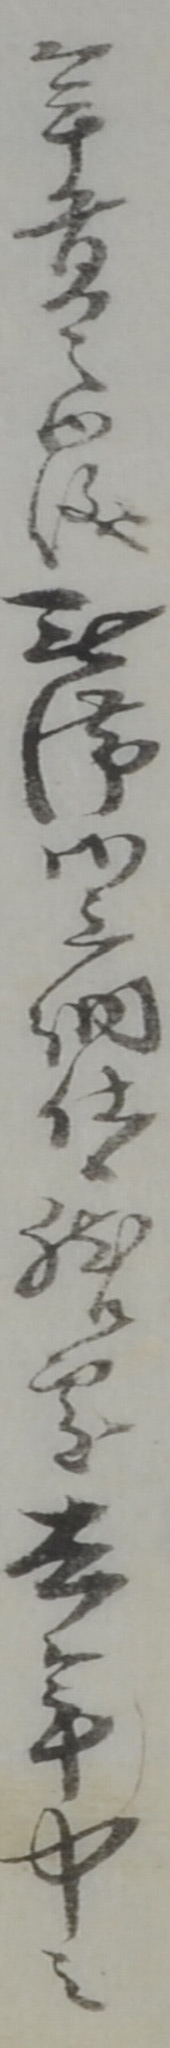年貢之御儀無滞御上納仕候然ル処去年中之
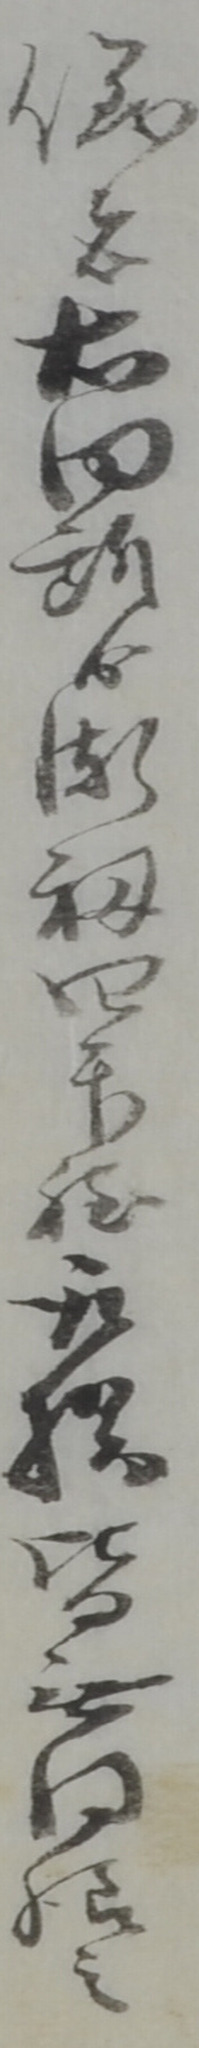儀者右田所より漸籾四升程取揚皆無同様之
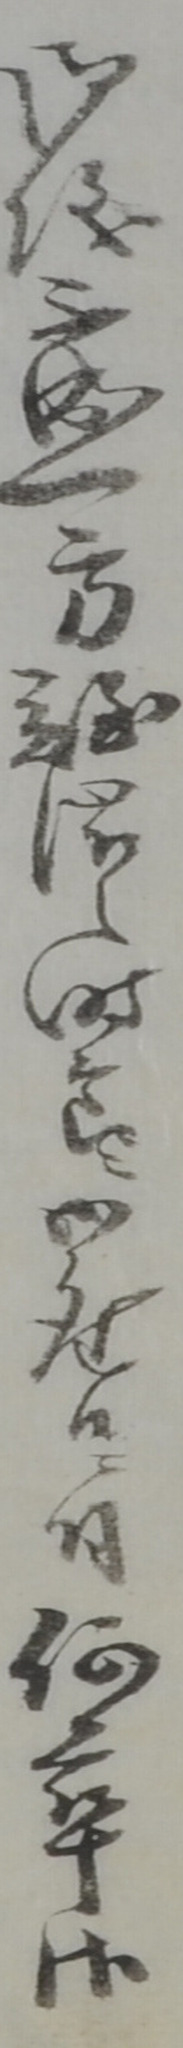御儀不成一方難渋之時節ニ御座候ニ付何卒御
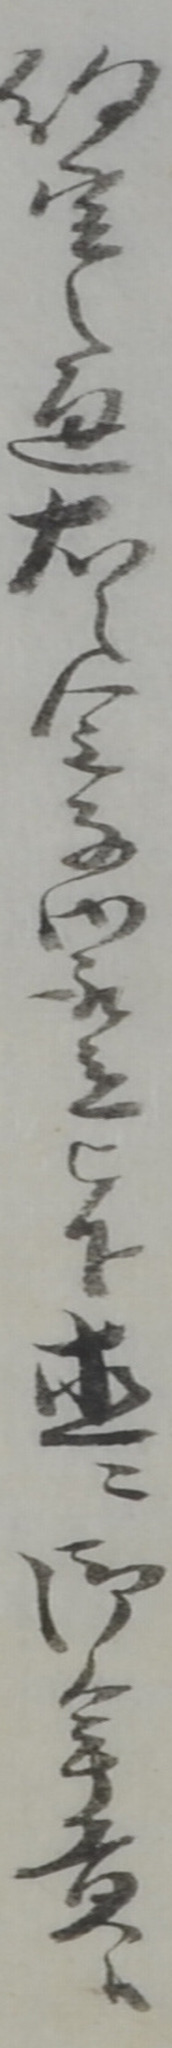約定之通右之金子御取立被下直ニ御年貢え
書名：諸願書控帳
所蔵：伊那市立高遠町図書館・合同会社AMANE
